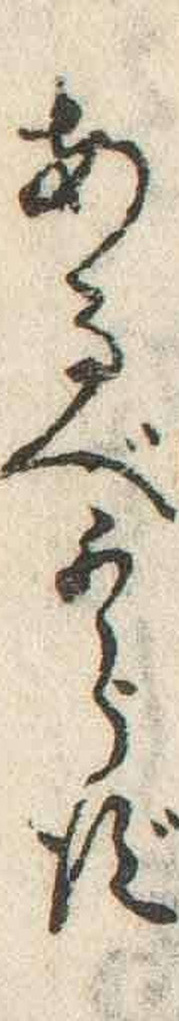あるべからず
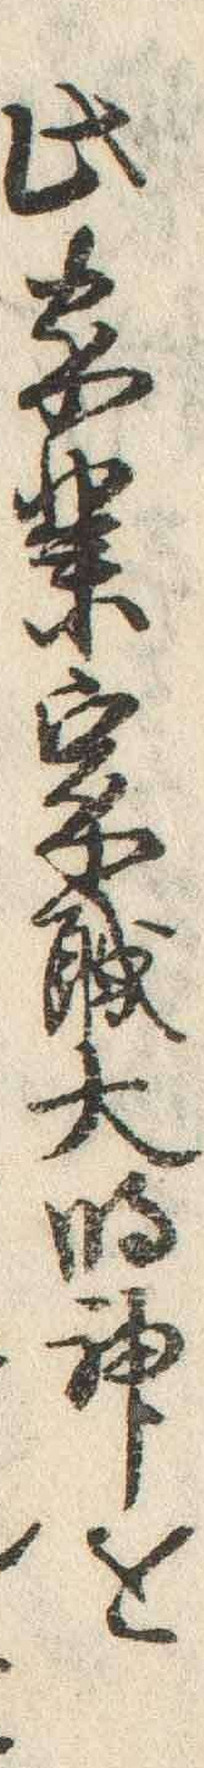此家業家職大明神を
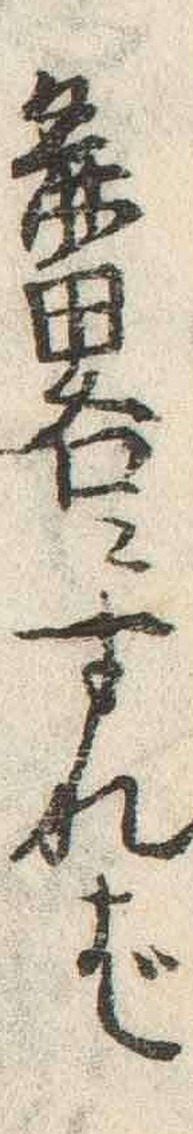麁略にすれば
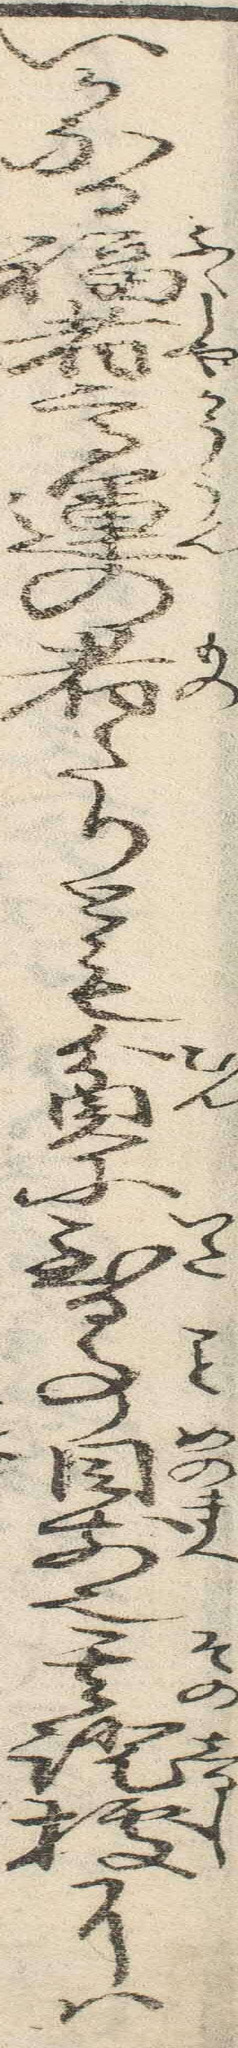いかなる福者高運の者たりとも貧に至る事目前也其証拠には
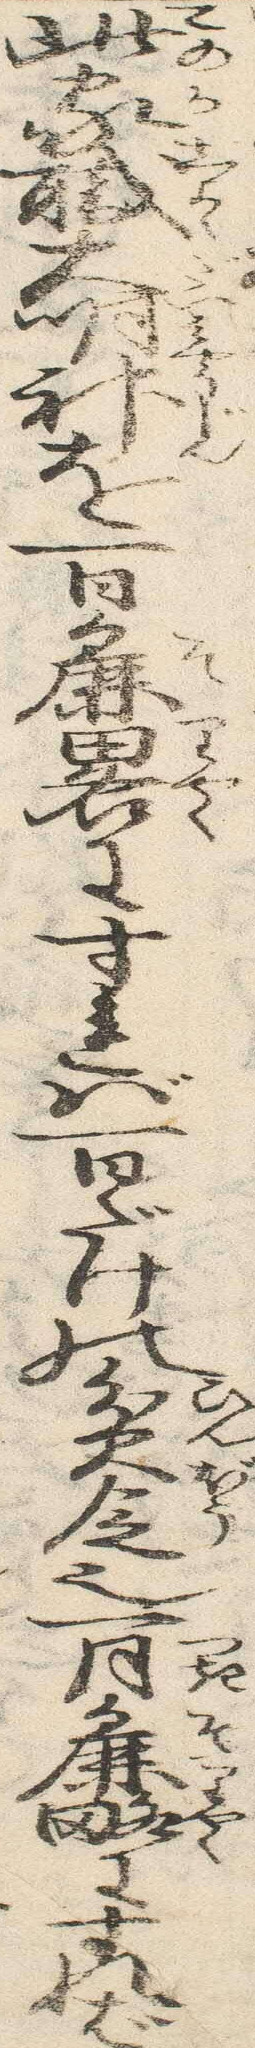此家職大明神を一日麁略にすれば一日だけの貧乏也一月麁略にすれば
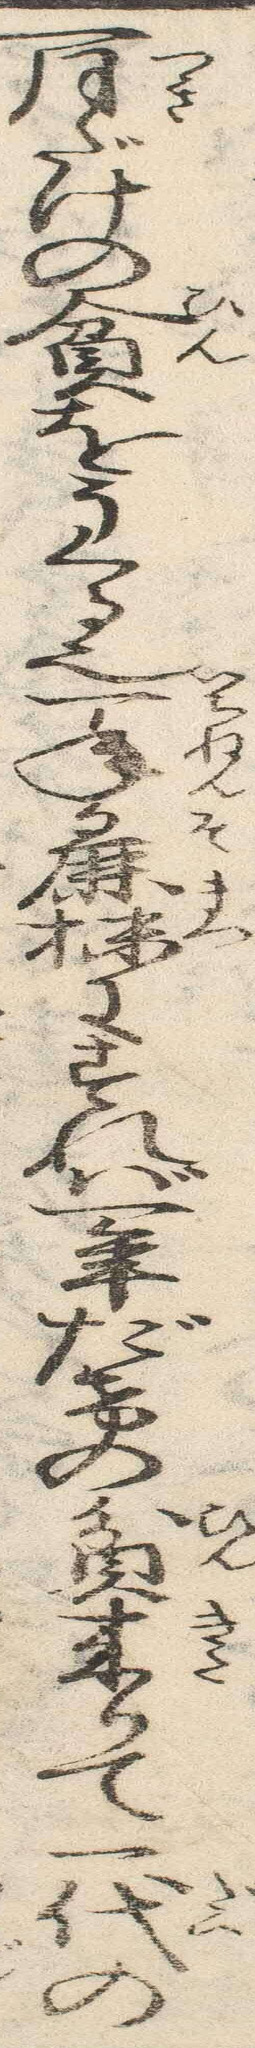一月だけの貧をうくる也一年麁抹にすれば一年だけの貧来りて一代の
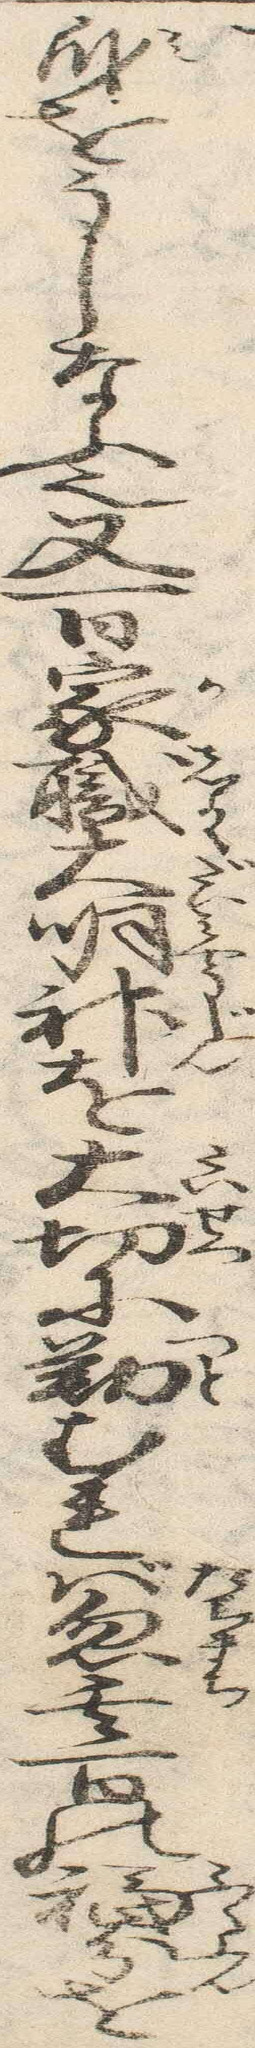身をうしなふ也又一日家職大明神を大切に勤むれば忽其一日の福分を
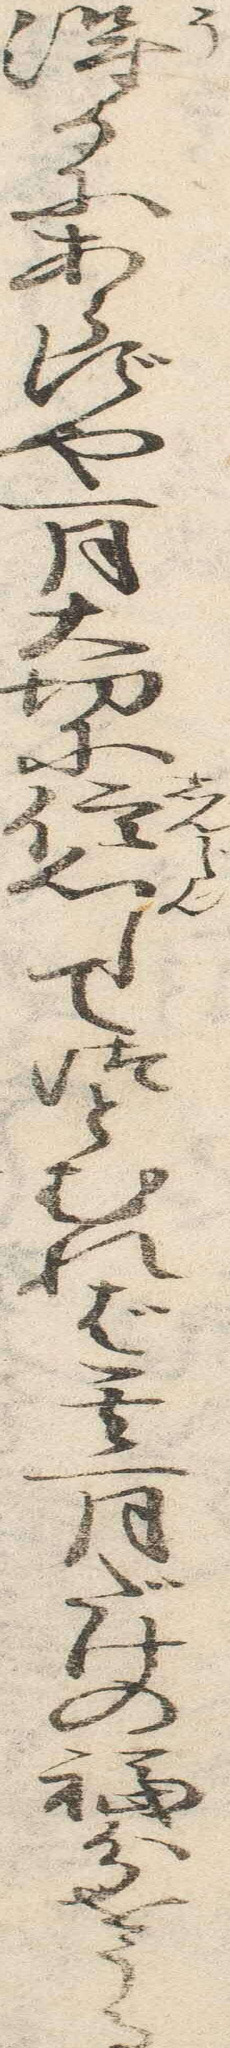得るにあらずや一月大切に信心してつとむれば其一月だけの福分をうる
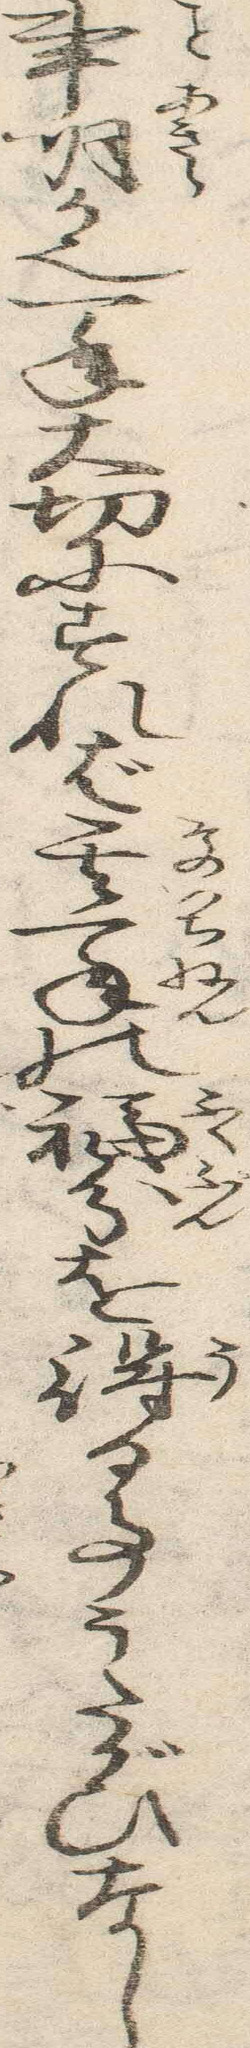事明か也一年大切にすれば其一年の福分を得る事うたがひなし
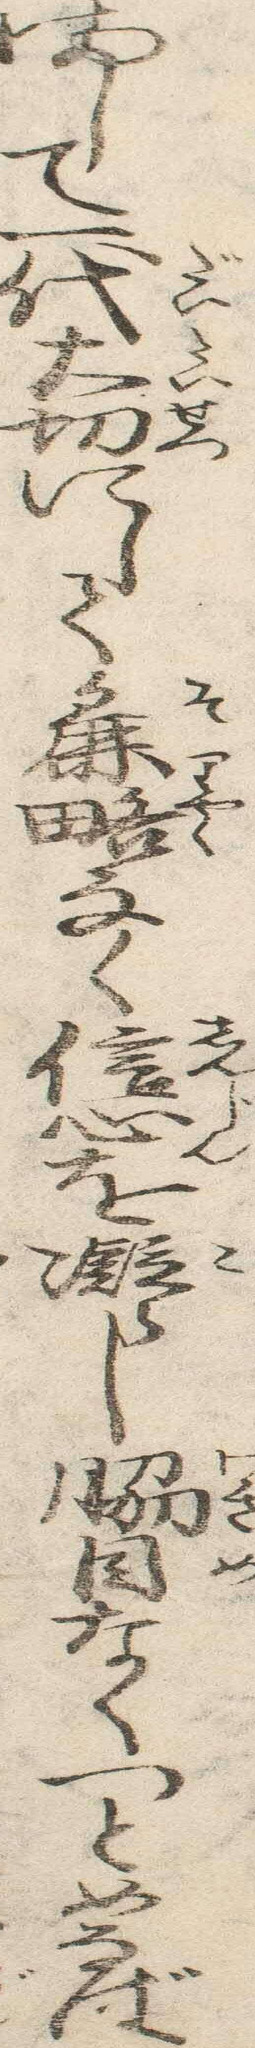まして一代大切にして麁略なく信心を凝らし脇目なくつとめなば
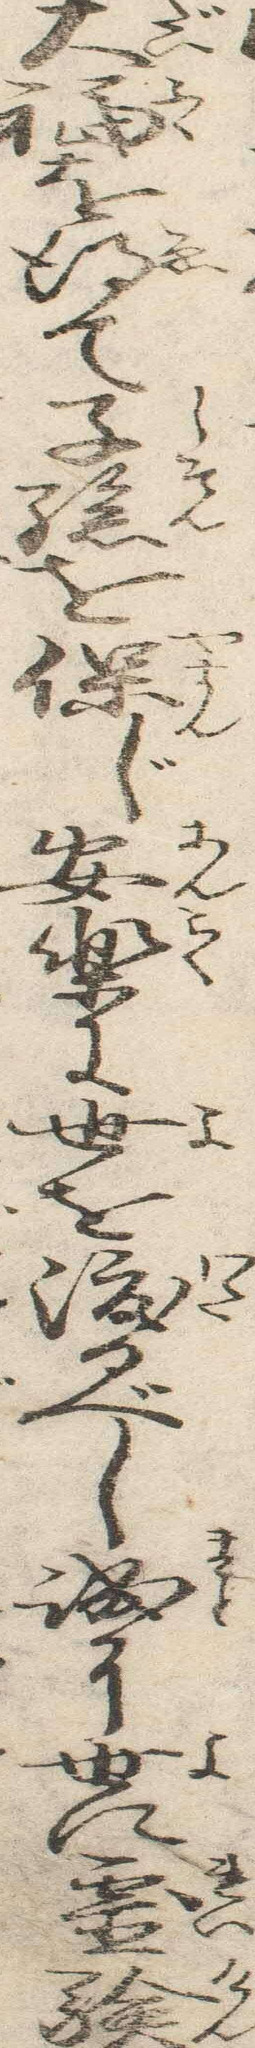大福を得て子孫を保じ安楽に世を渡るべし誠に世に霊験
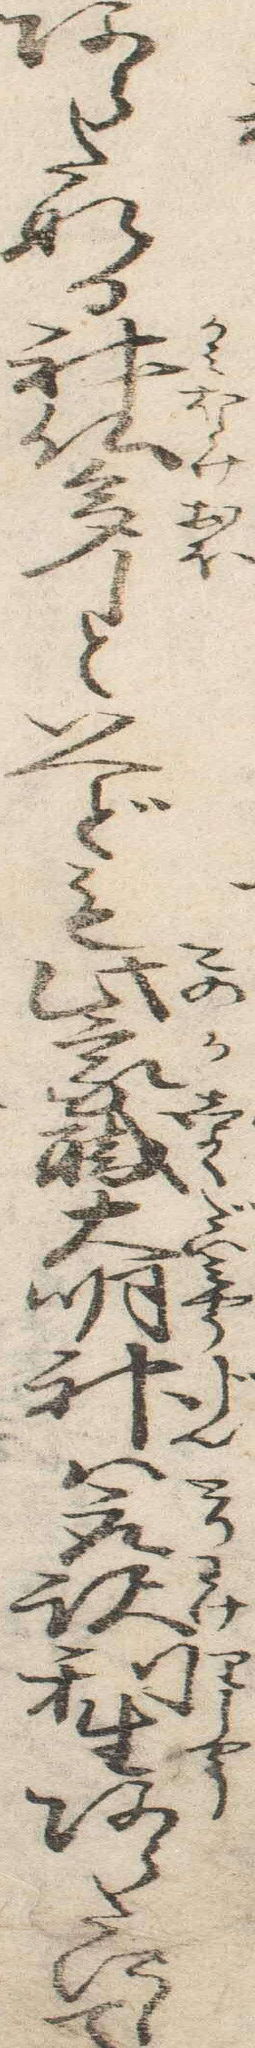あらたなる神仏多しといへども此家職大明神は取訳利生あらたにして
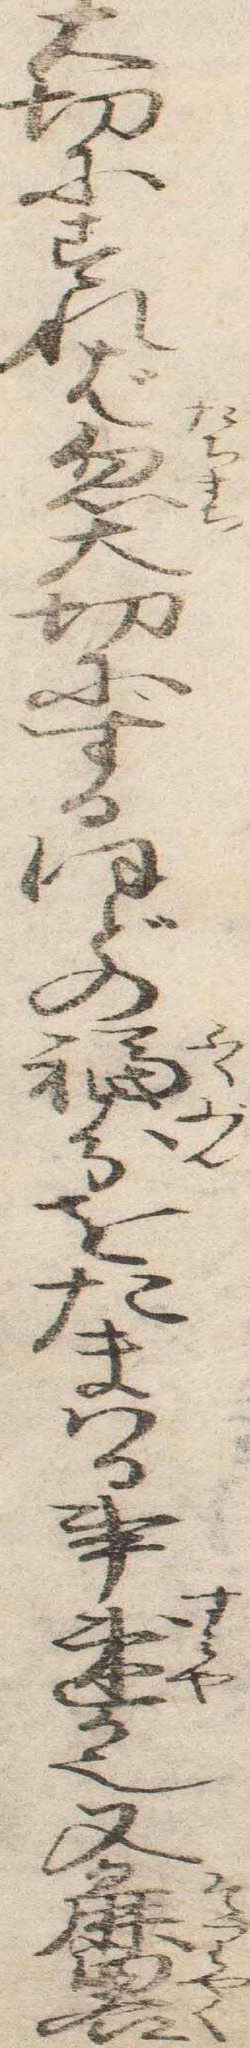大切にすれば忽大切にするほどの福分をたまはる事速か也又麁略
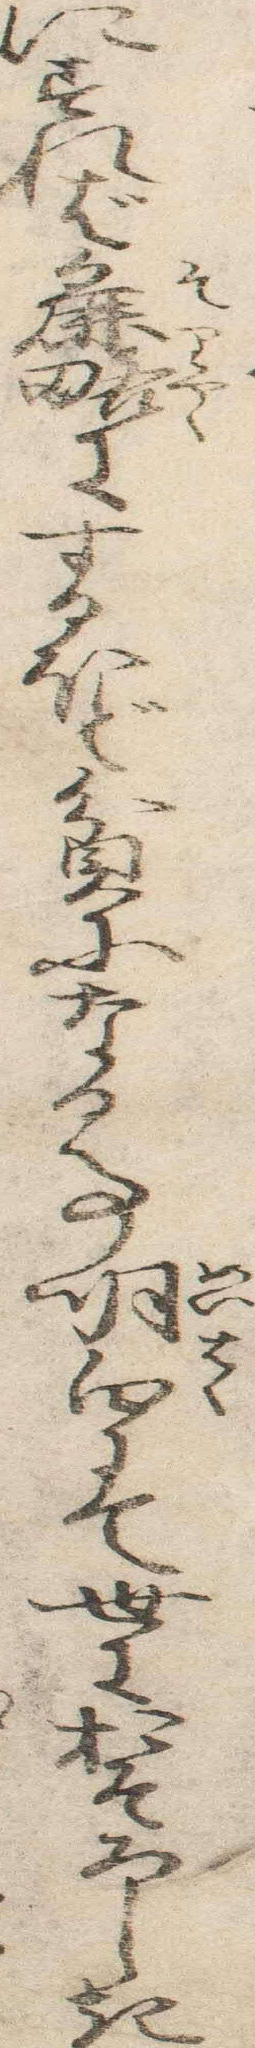にすれば麁略にするほど貧になる事明白にて世におそろしき
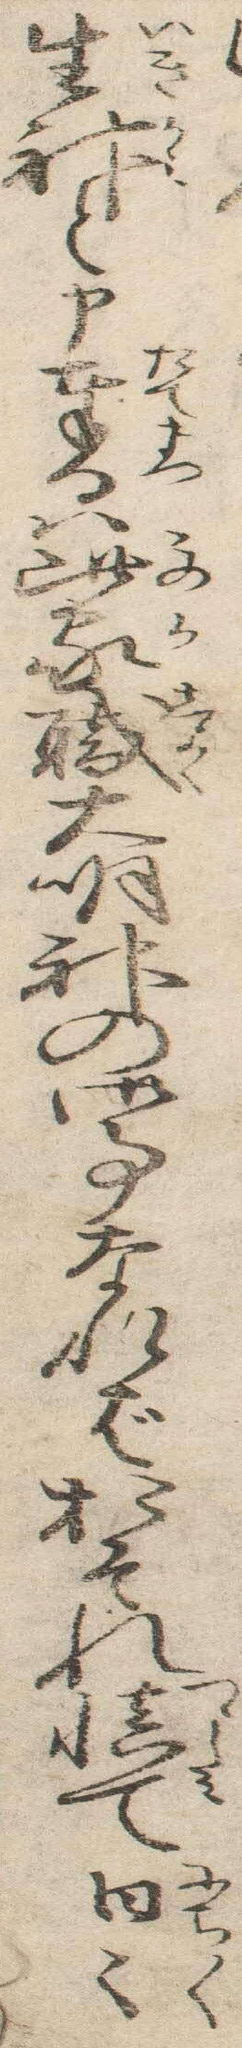生神と申奉るは此家職大明神の御事なればおそれ慎みて日々

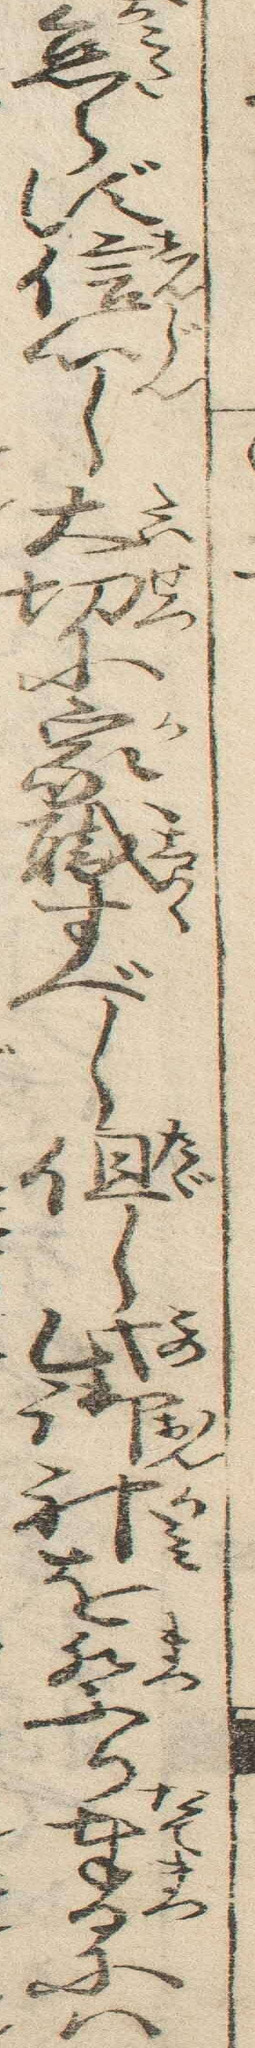怠らず信心し大切に家職すべし但し此御神を祭り奉るには
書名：撫育草
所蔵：東京学芸大学附属図書館 国文学研究資料館
